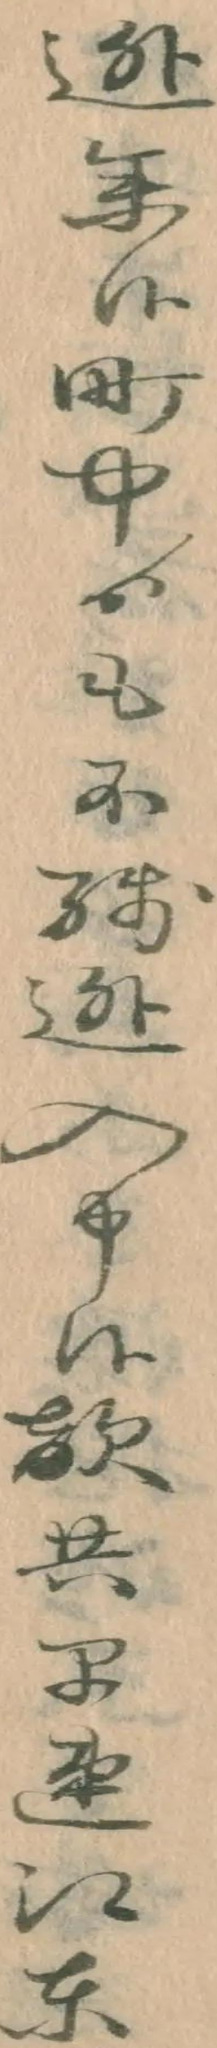逃参候町中ゟも不残逃入申候敵共早速江東
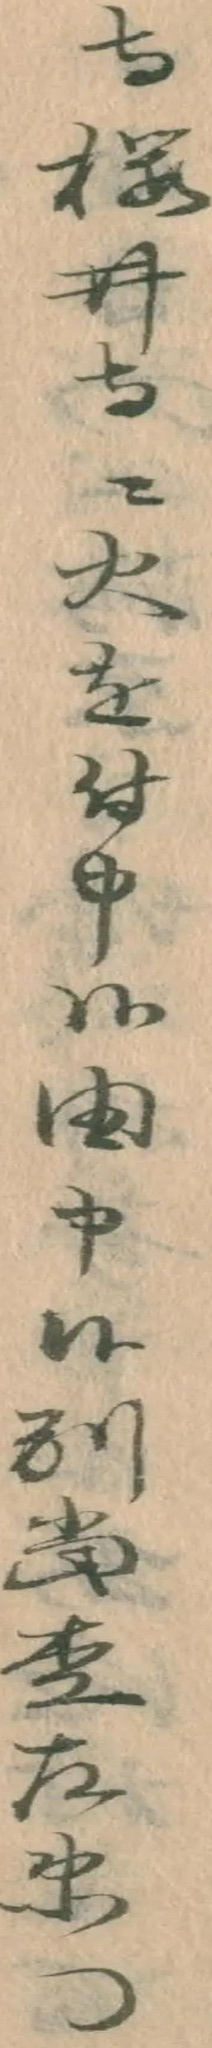寺桜井寺に火を付申候由申候別当杢左衛門
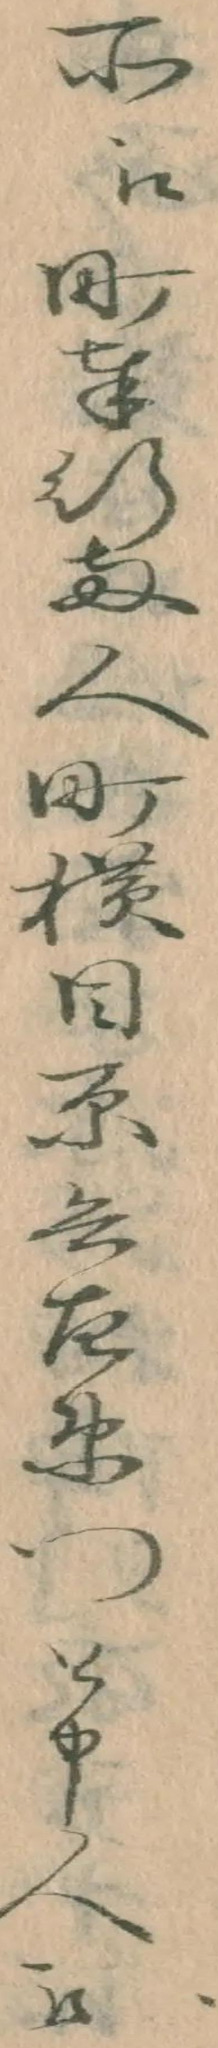所え町奉行両人町横目原兵左衛門と申人被
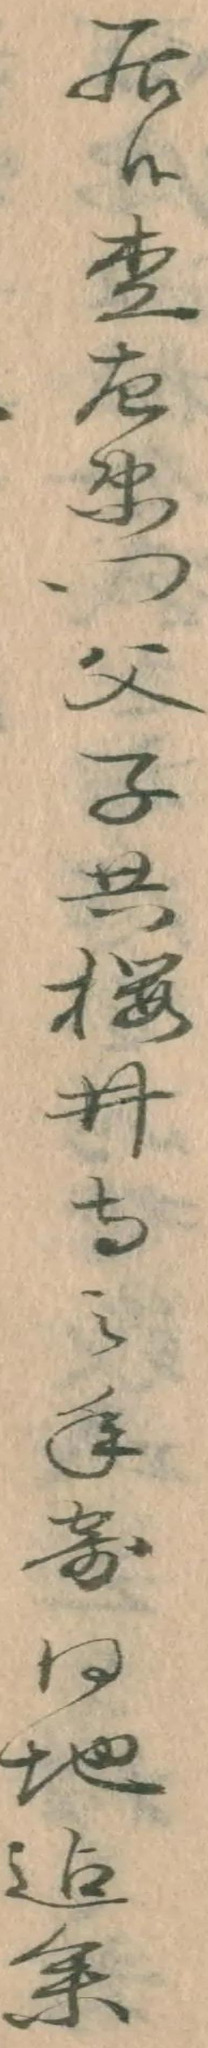居候杢左衛門父子共桜井寺之手寄同地迄参
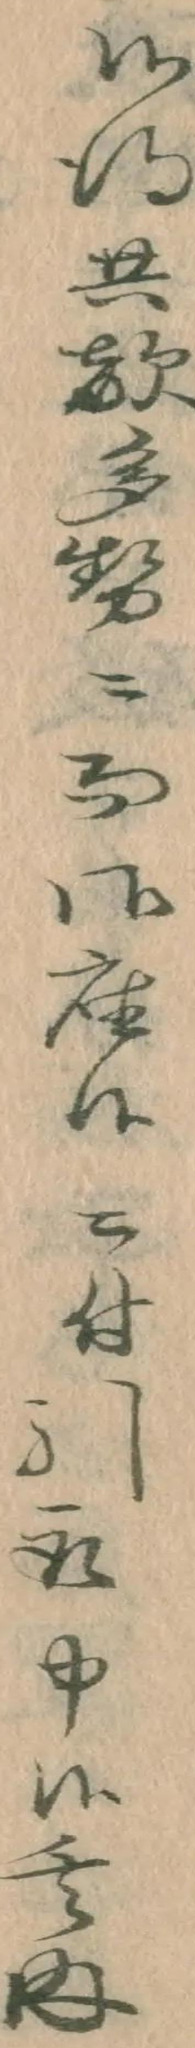候得共敵多勢に而御座候に付引取申候其内
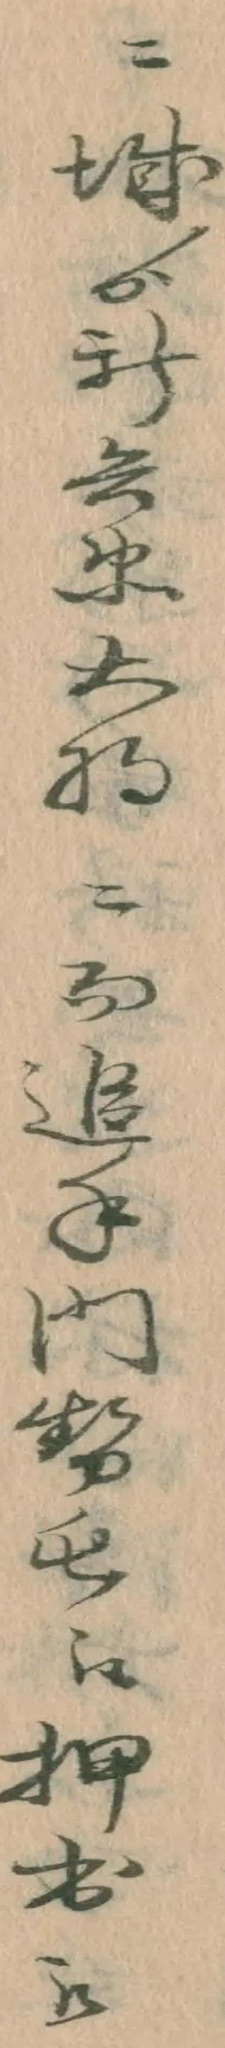に城ゟ新兵衛大将に而追手門勢屯え押出被
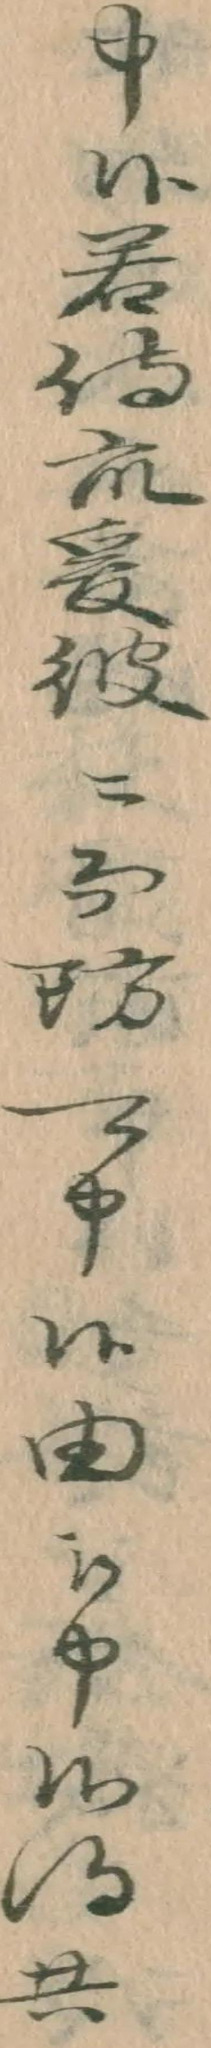申候若侍衆爰彼に而防可申候由被申候得共
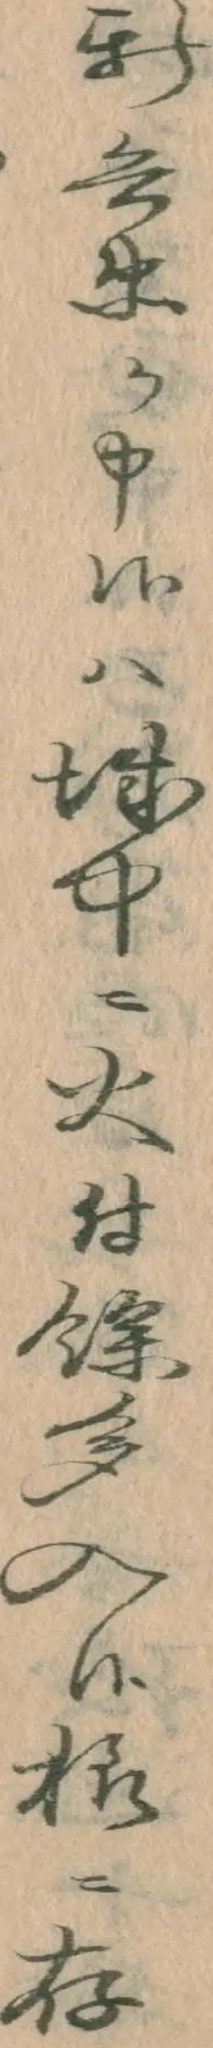新兵衛か申候は城中に火付余多入候様に存
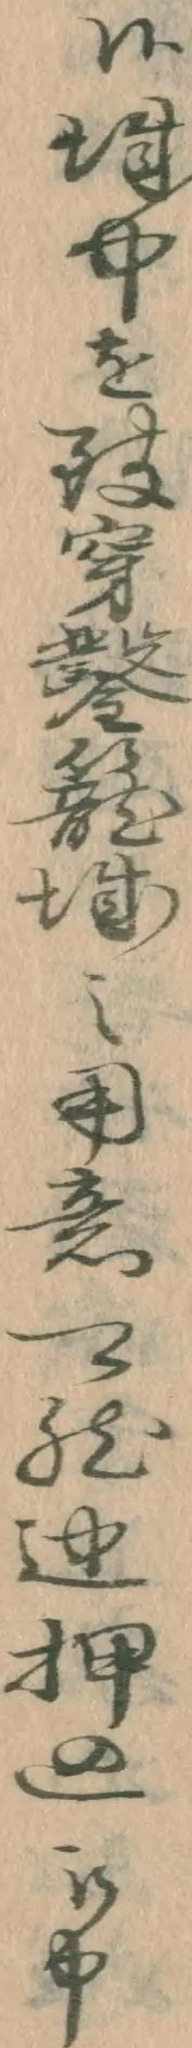候城中を致穿鑿籠城之用意可然迚押込被申
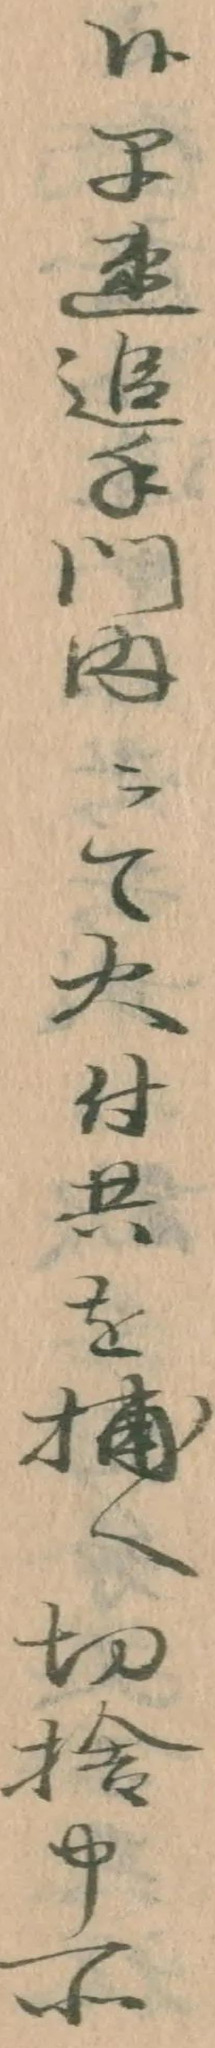候早速追手門内にて火付共を捕へ切捨申所
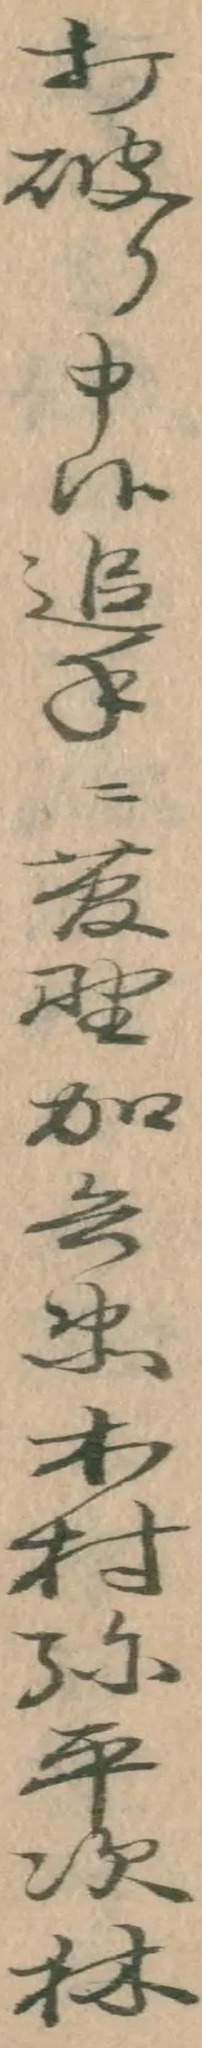打破り申候追手に菅野加兵衛木村弥平次林
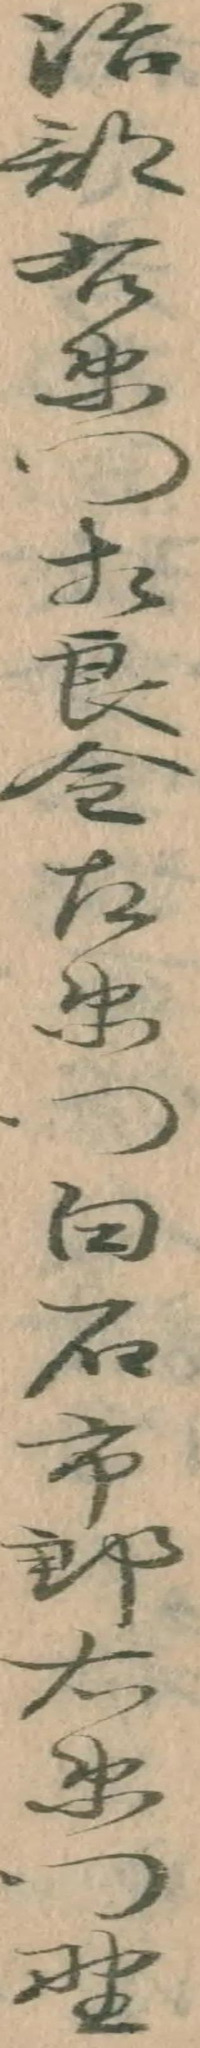治部右衛門相良金左衛門白石市郎右衛門野
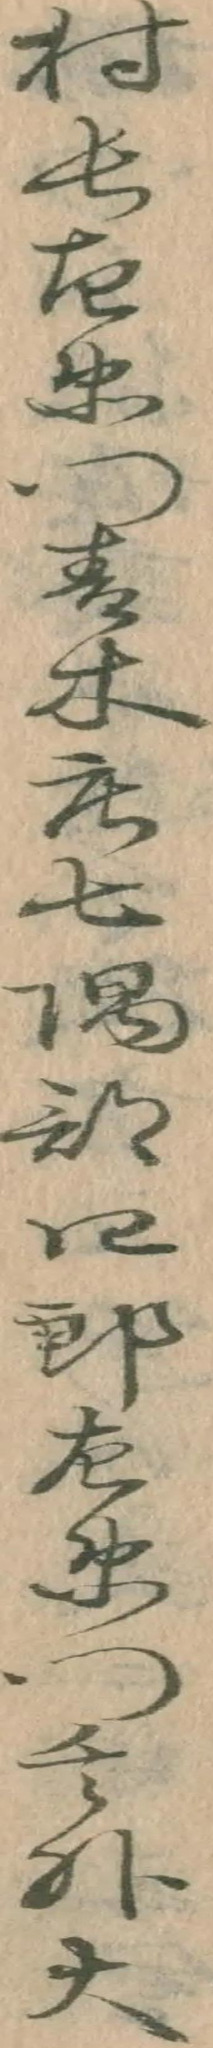村長左衛門青木庄七隅部四郎左衛門其外大
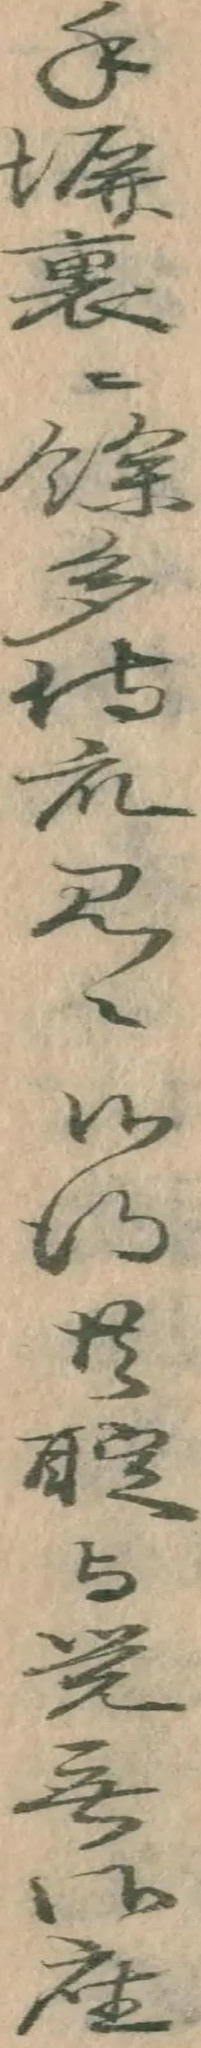手塀裏に余多侍衆見に候得共聢与覚無御座
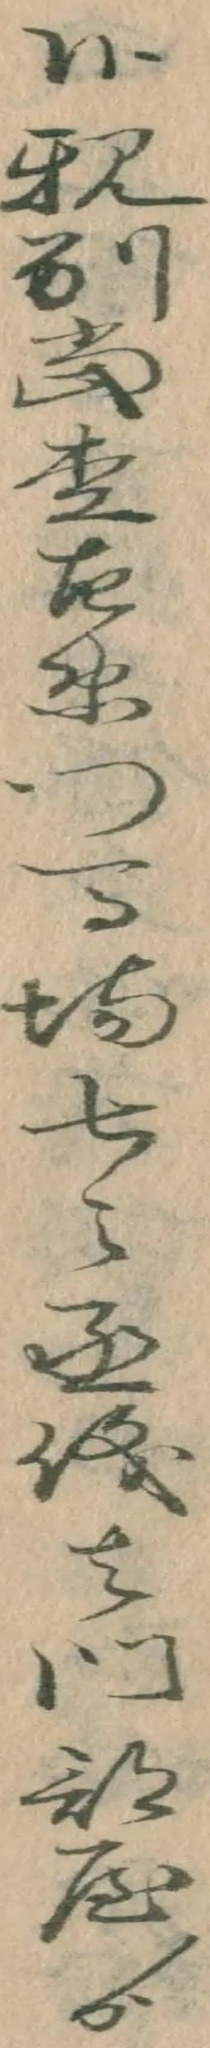候親別当杢左衛門馬場七之丞儀者門部屋ゟ
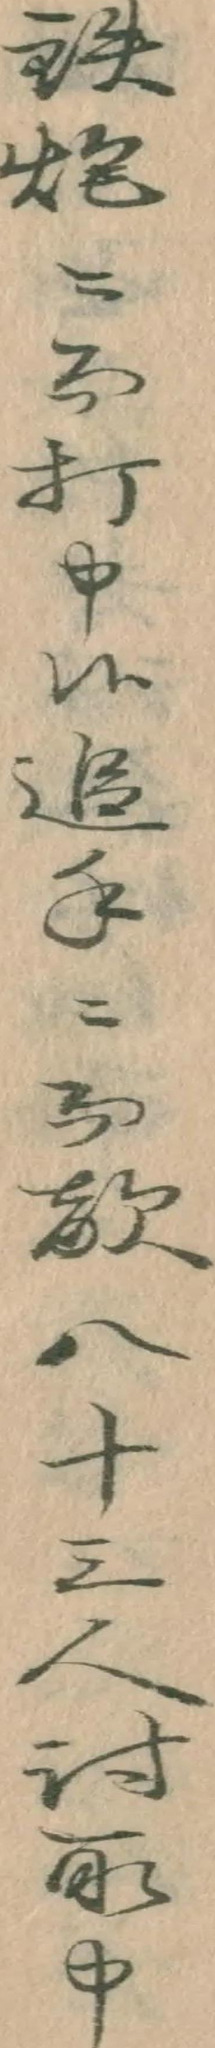鉄炮に而打申候追手に而敵八十三人討取申
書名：切支丹御退治記 49巻. [1]
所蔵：国立国会図書館 National Diet Library, JAPAN
